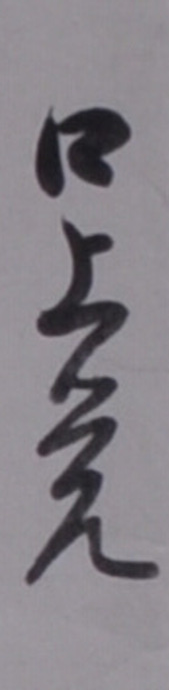口上覚
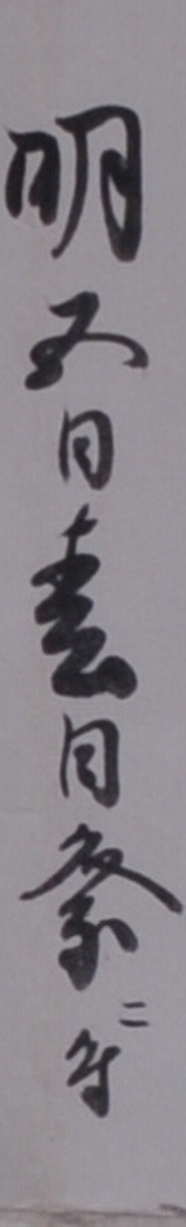明五日春日祭に付
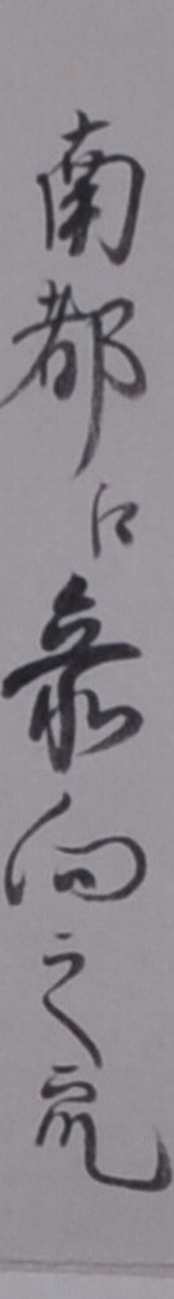南都え参向之衆
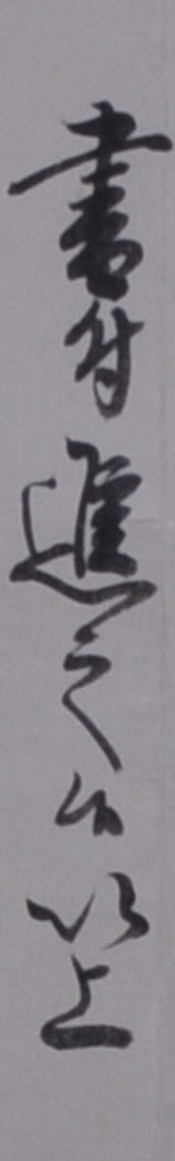書付進之候以上
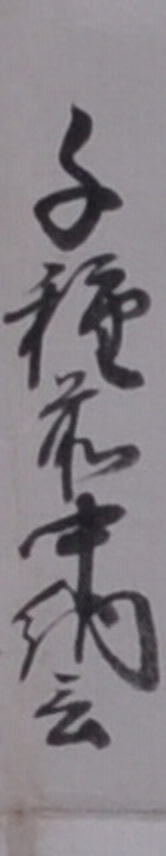千種前中納言
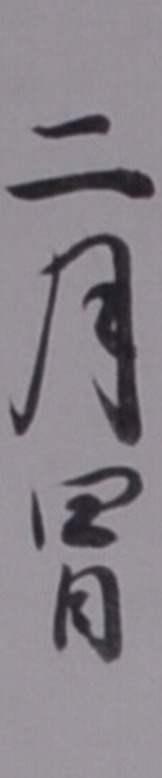二月四日
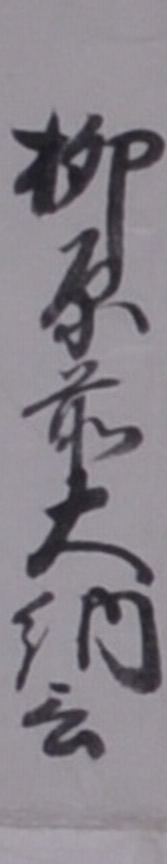柳原前大納言
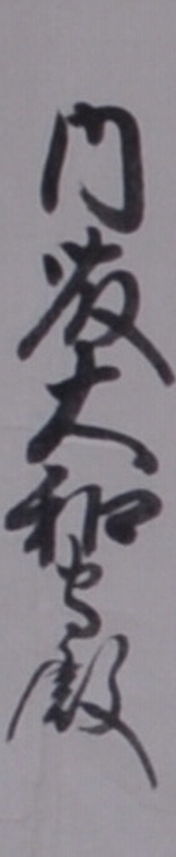内藤大和守殿
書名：口上覚
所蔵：伊那市立高遠町図書館・合同会社AMANE
